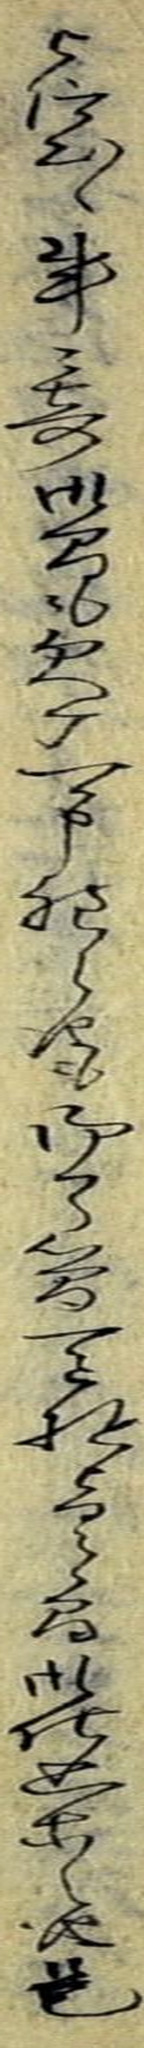被仰出候事に寄御間も欠ヶ可申程之儀も御了簡被遊候旨に候間御供廻等之儀是
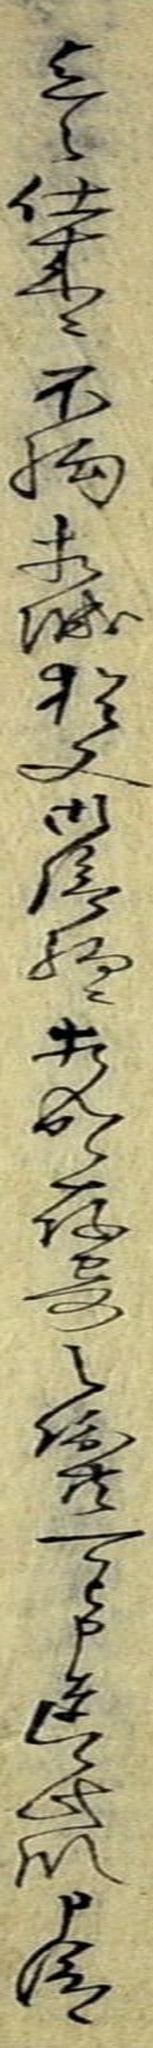迄之仕来に不拘相減猶又御倹約に相成候存寄之儀共可被申達候此段申渡候
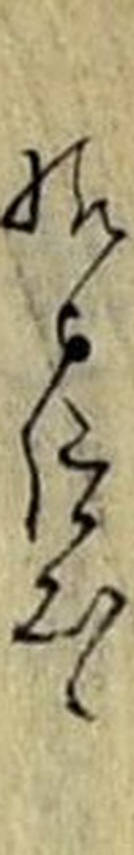様被仰出候
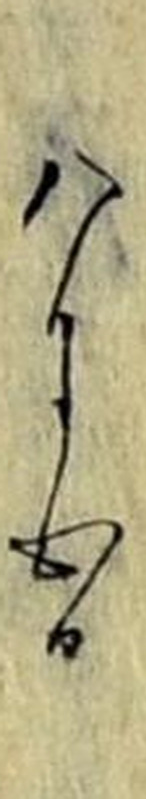八月五日
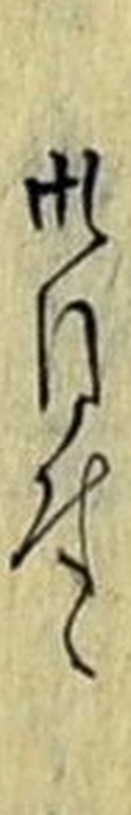御目付へ
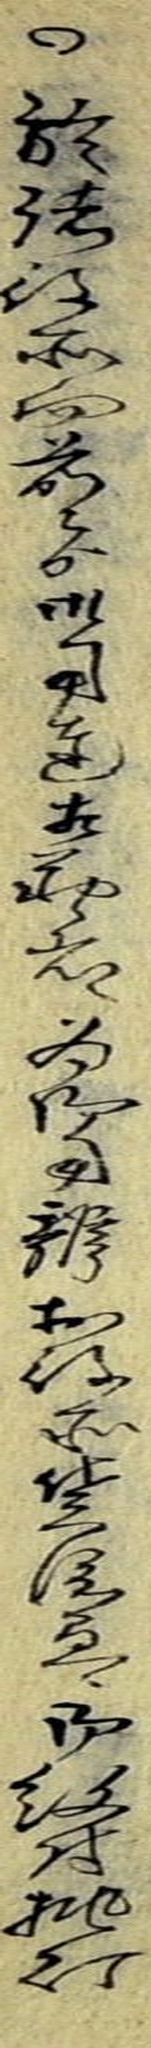○於諸役所向前々ゟ御用達相勤候者へ為御用弁於役所貸渡置候御紋付桃灯
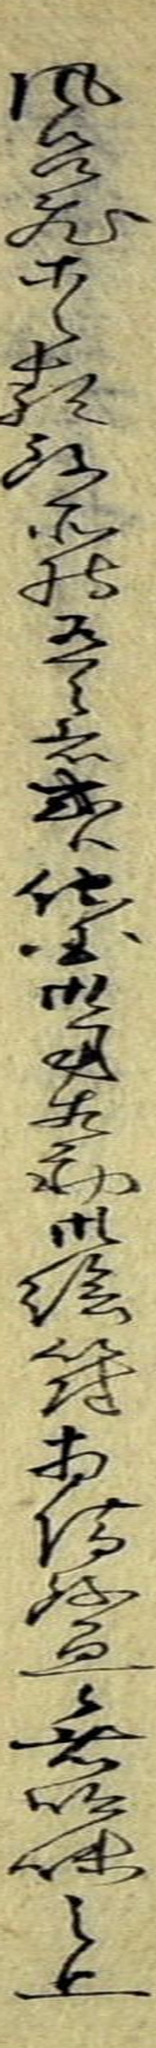風呂敷等之類致所持有之者或は他国御用相勤御絵符拝借致置候者吟味之上
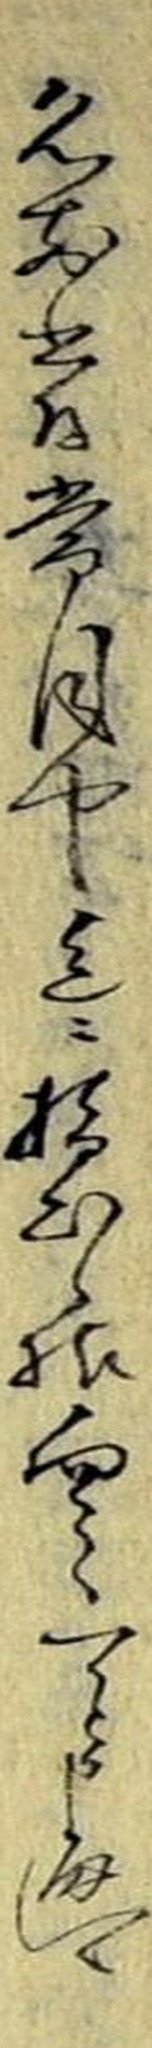名前書付当月中迄に指出候様向々へ可被申通候

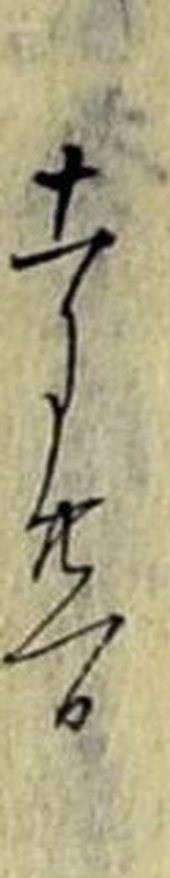十一月廿一日
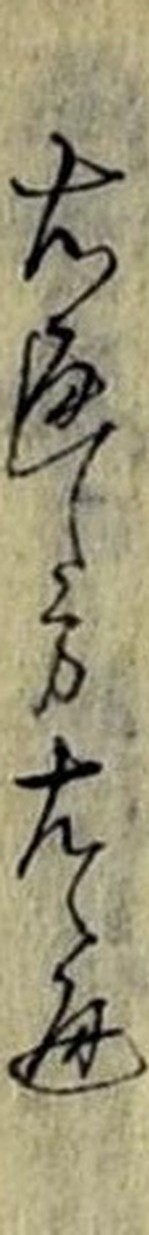右通之方左之通
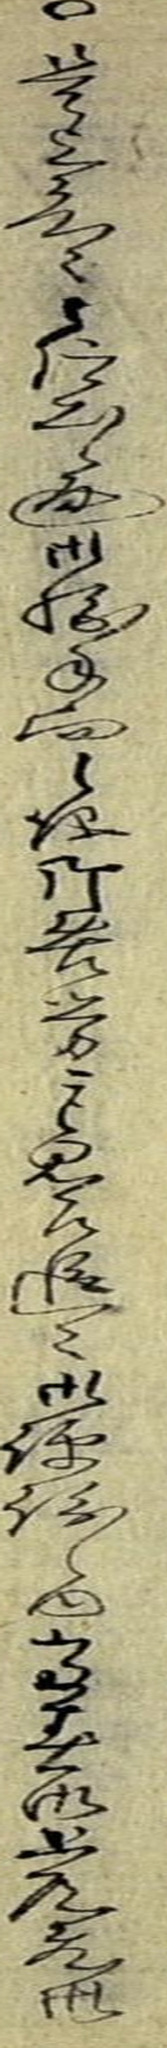○是迄度々被仰出候通御勝手向之儀御苦労に被思召追々御評議之内当春御上屋敷御
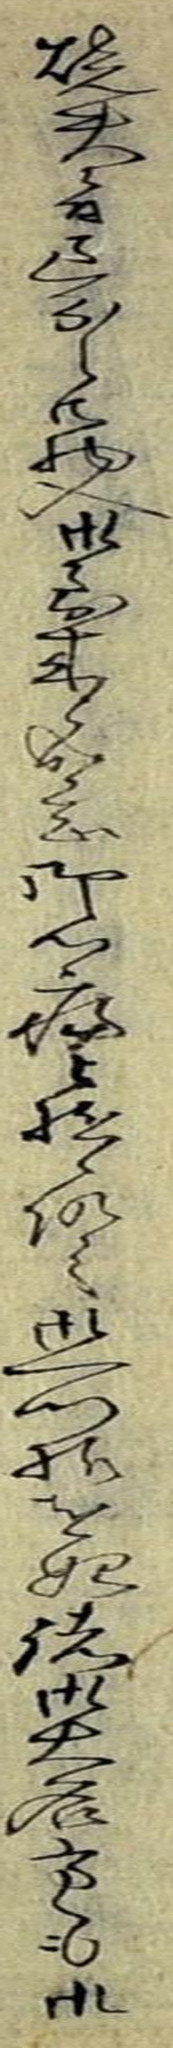焼失に付過分之御物入御到来被成候甚御心痛被遊候仍之御一門様を始諸御大名方へも御
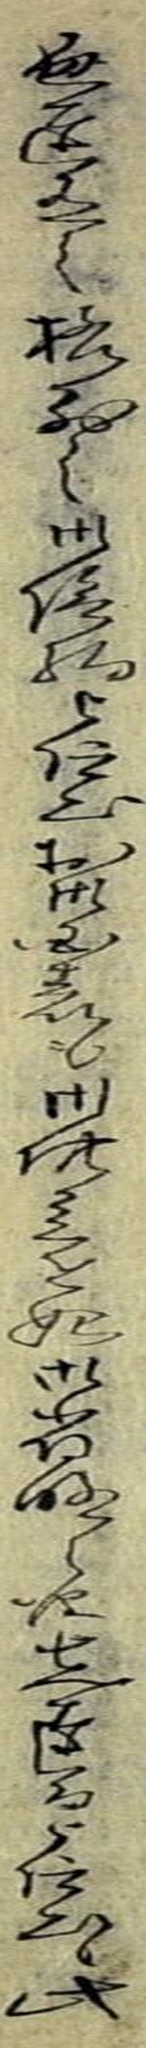通達有之格別之御倹約被仰出於御国表も御供立を始御省略之儀先達而被仰出候此
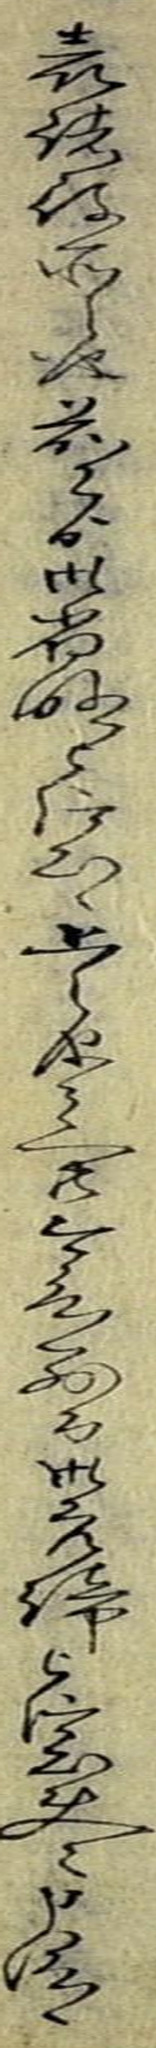表諸役所之儀前々ゟ御省略被仰出候上之儀に候へ共今度別而御取締被仰出夫々申渡候
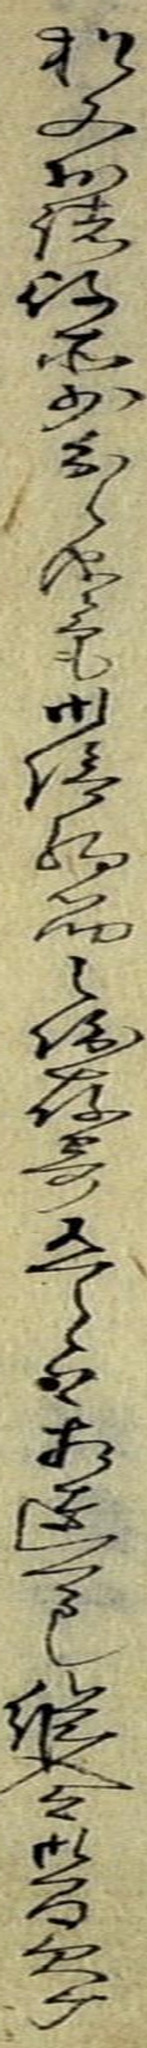猶又於諸役所少分之儀に而も御倹約筋之儀存寄有之候はヽ相達可申候縦令御間欠ヶ
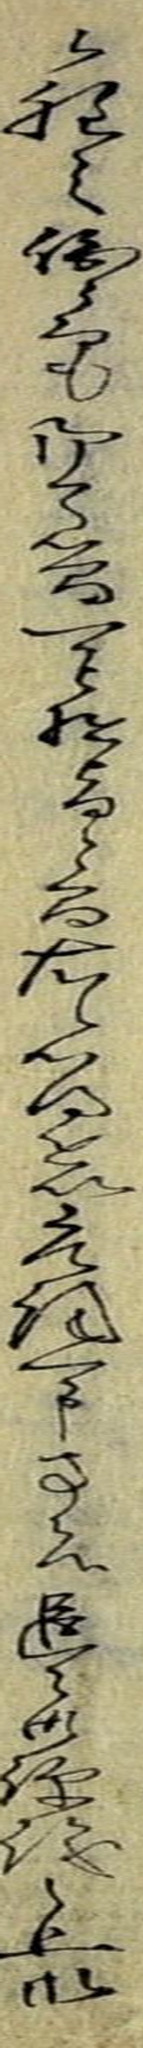候程之儀に而も御了簡可被遊旨に候間右心得を以取調可申事に候追々御評議之上御
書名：命令之部 四
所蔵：福井県文書館 Fukui Prefectural Archives
